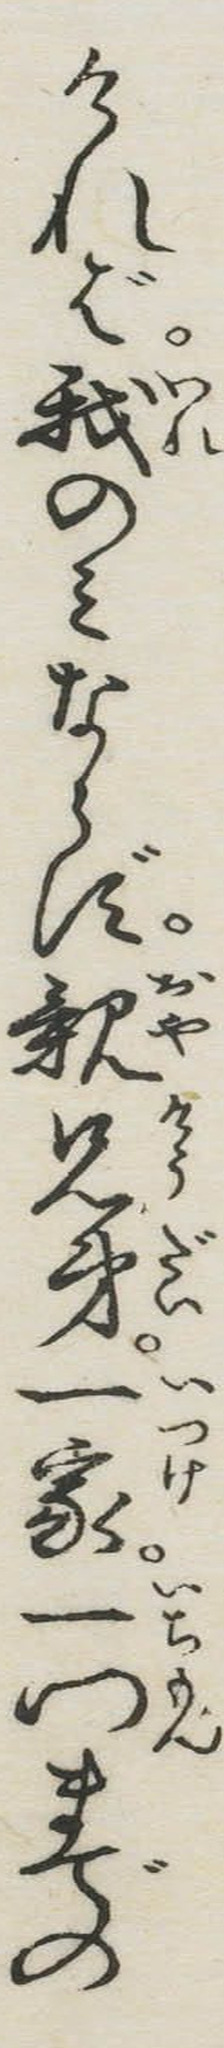ければ。我のみならず。親兄弟。一家。一門までの
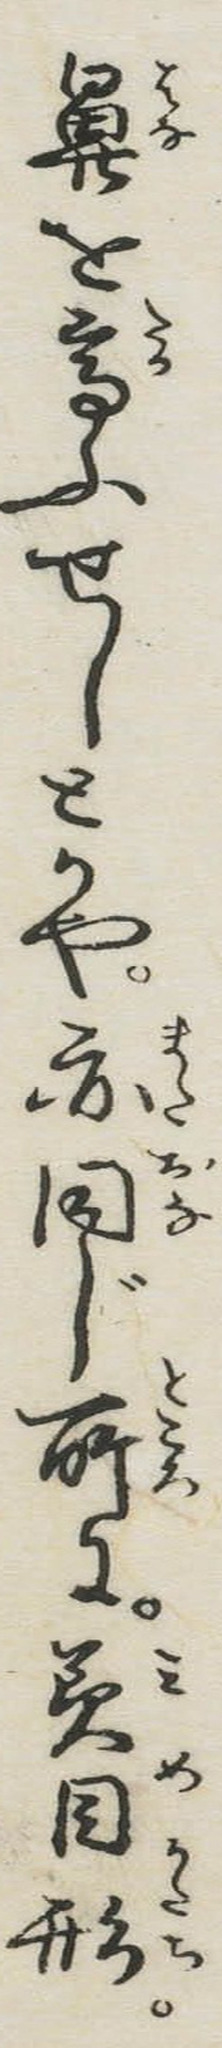鼻を高ふせしとかや。亦同じ所に。美目形。
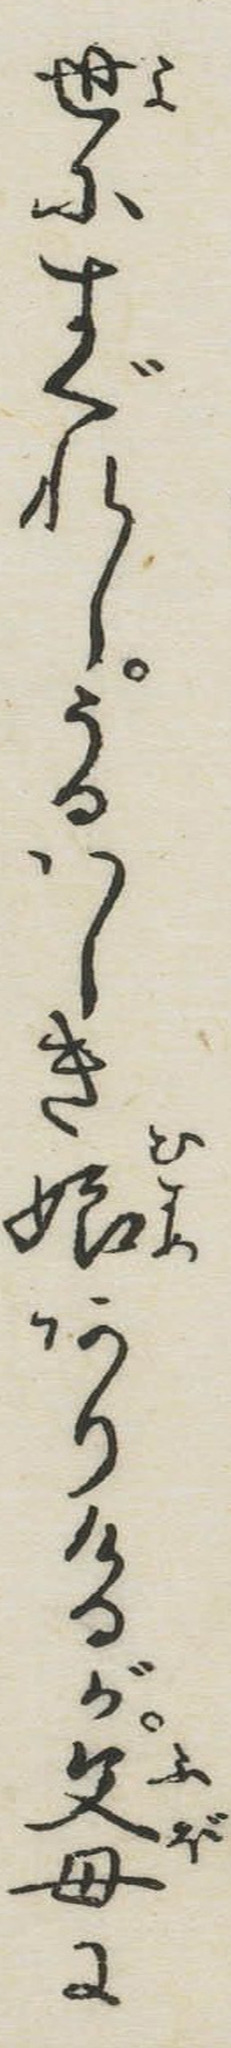世にすぐれし。うるはしき娘ありけるが。父母に
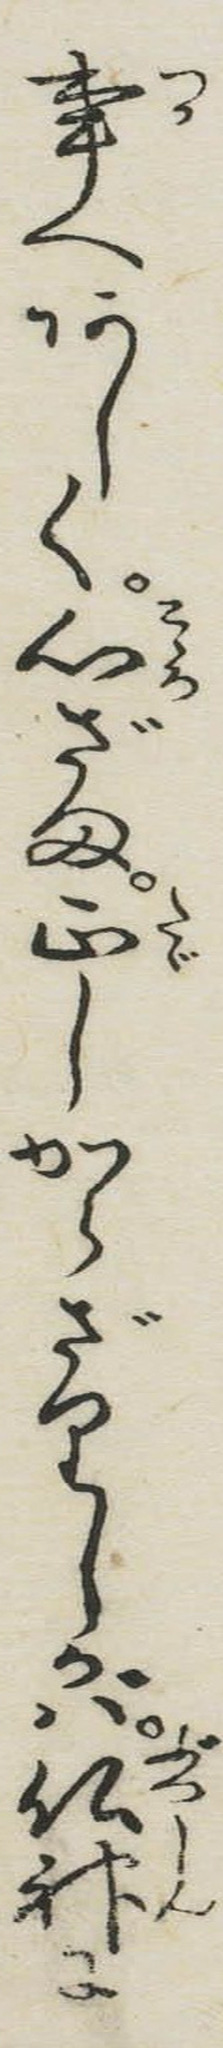事へあしく。心ざま。正しからざりしかば。仏神に
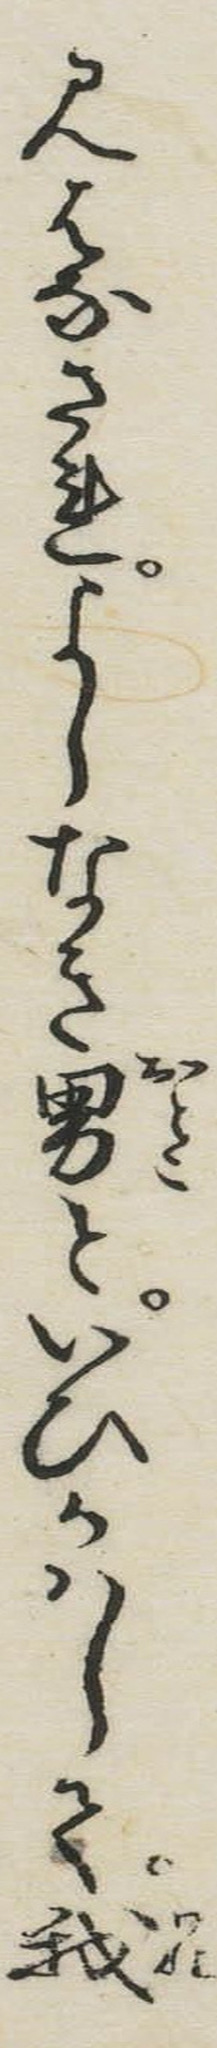見はなされ。よしなき男と。いひかはして。我
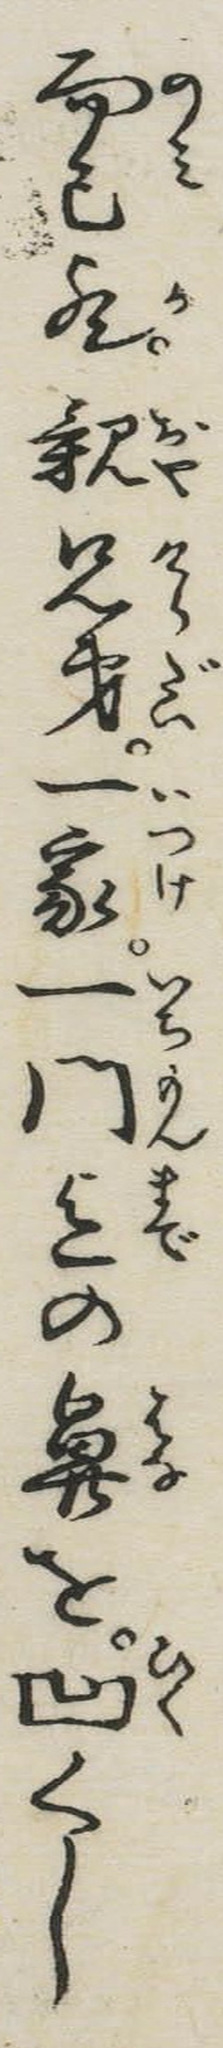而已歟。親兄弟。一家。一門迄の鼻を。凹くし

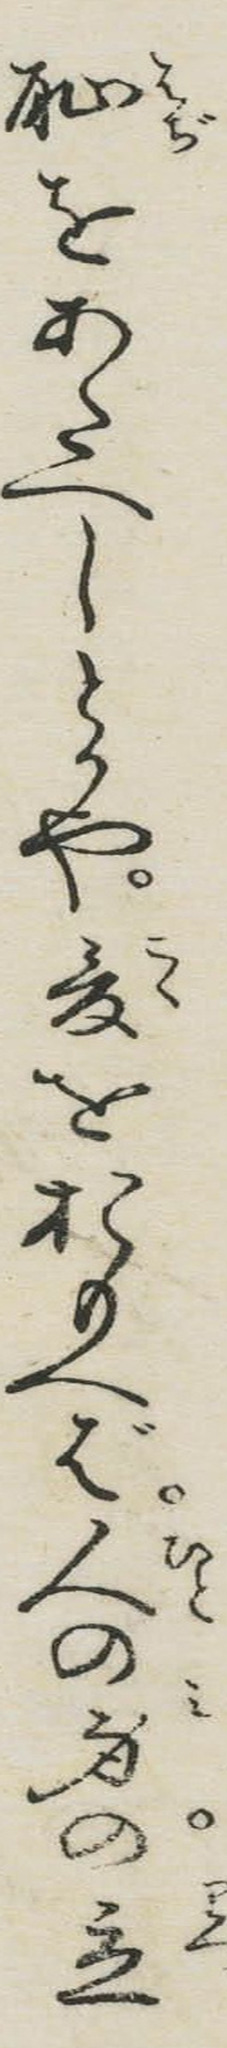恥をあたへしとかや。爰をおもへば。人の身の。立
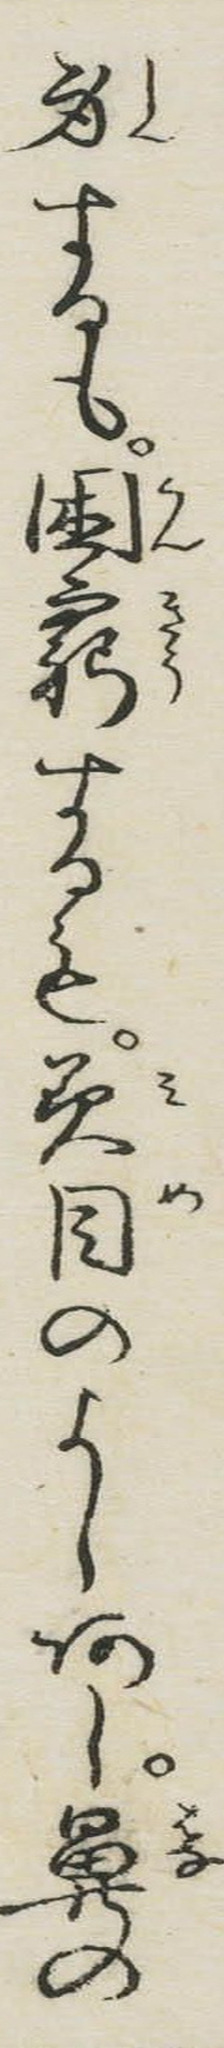身するも。困窮するも。美目のよしあし。鼻の
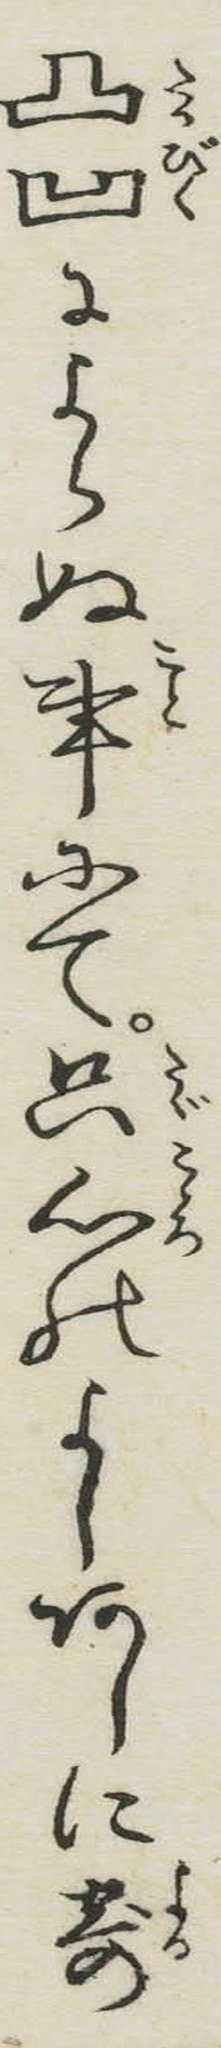凸凹によらぬ事にて。只心のよしあしに寄
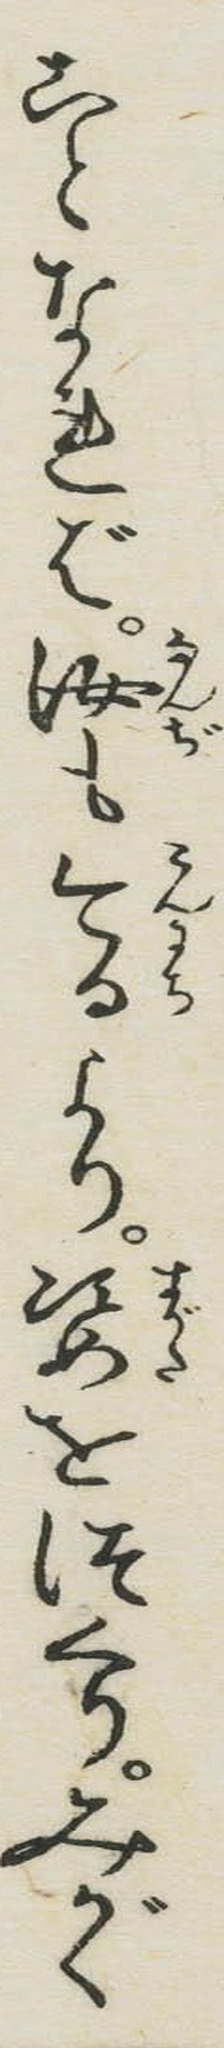ことなれば。汝も今日より。姿をつくり。みがく
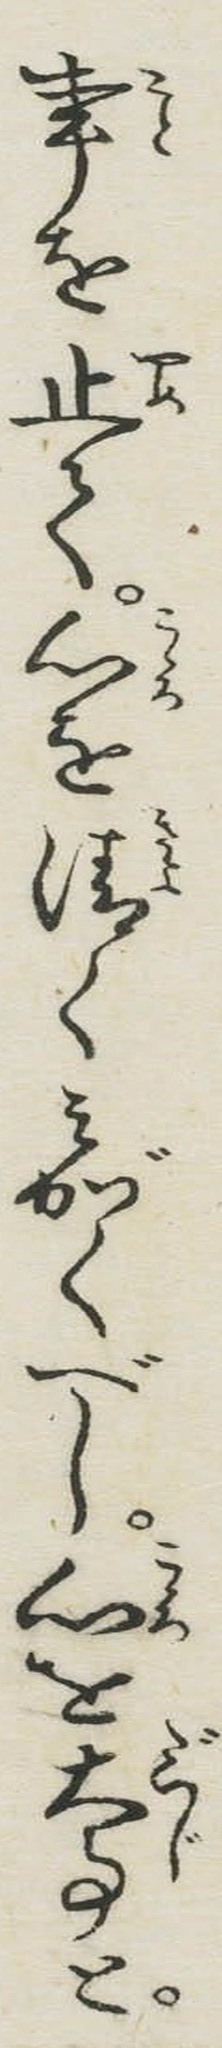事を止て。心を清くみがくべし。心を大事と。
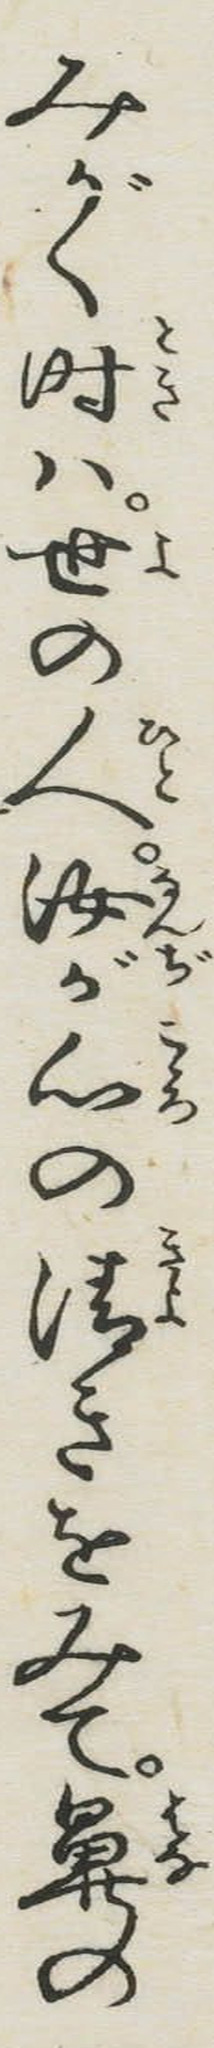みがく時は。世の人。汝が心の清きをみて。鼻の
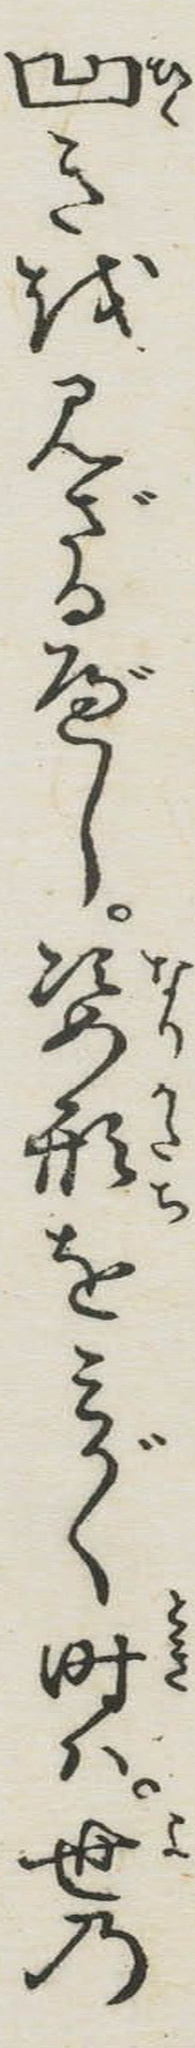凹きを見ざるべし。姿形をみがく時は。世の
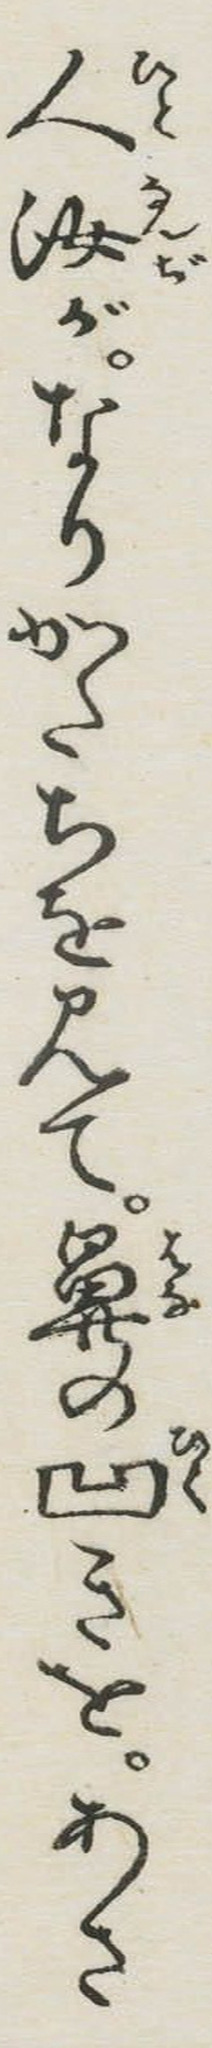人汝が。なりかたちを見て。鼻の凹きを。あさ
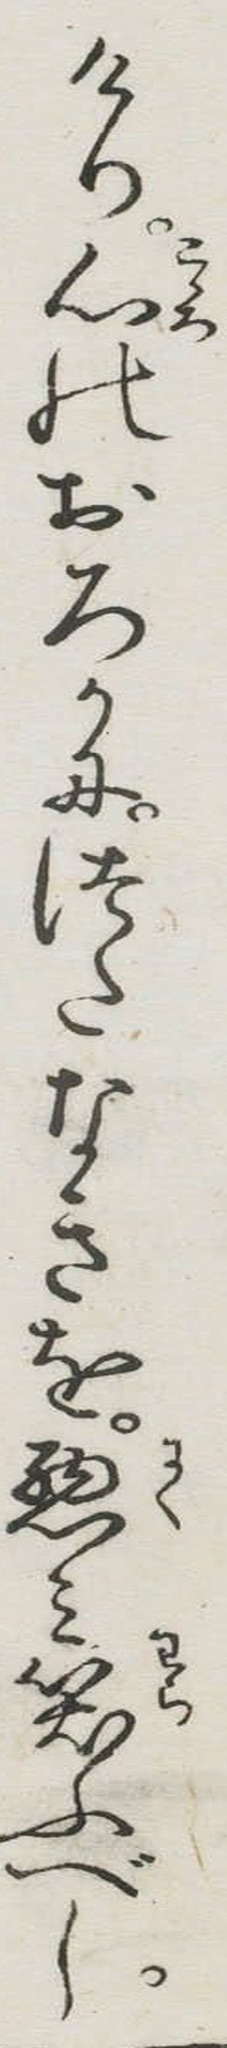けり。心のおろかに。つたなきを。悪み笑ふべし。
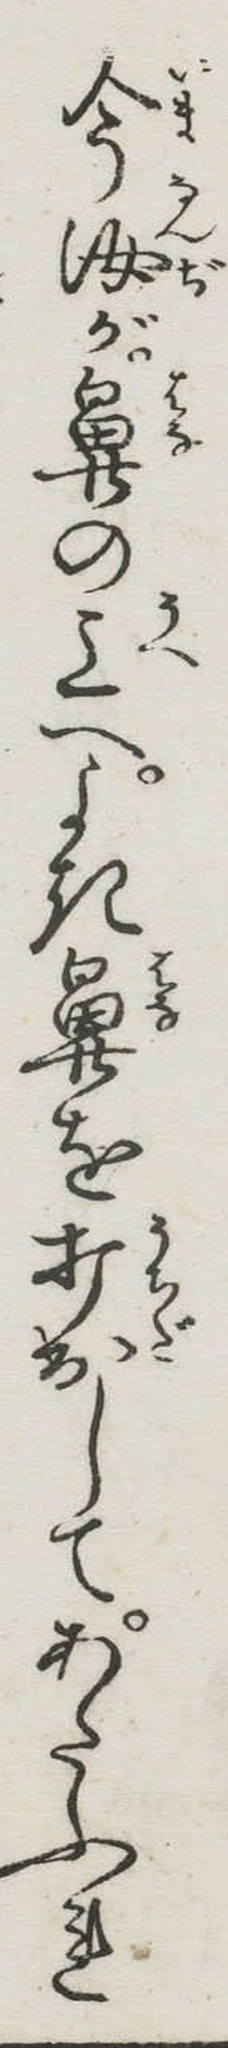今汝が。鼻の上へ。よき鼻を打出して。あたふれ
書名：福神おしへの小槌 2巻 上
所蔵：東京学芸大学教育コンテンツアーカイブ
